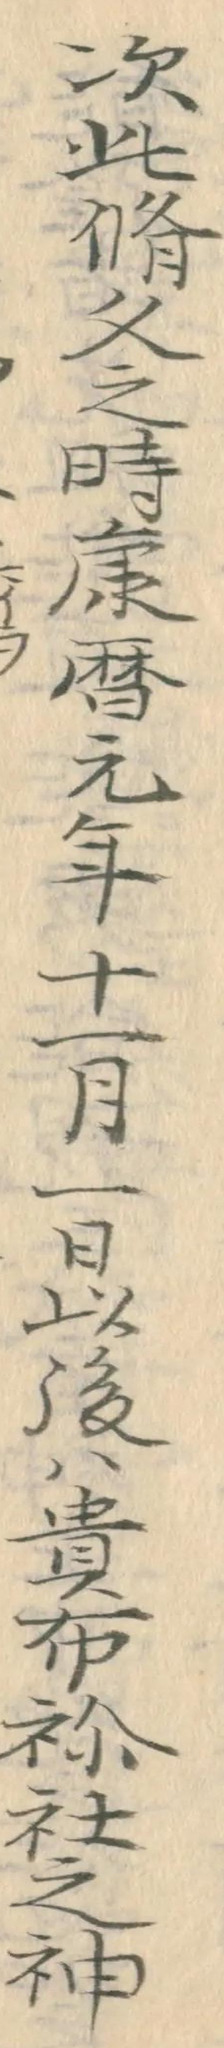次此脩久之時康暦元年十一月一日以後ハ貴布祢社之神
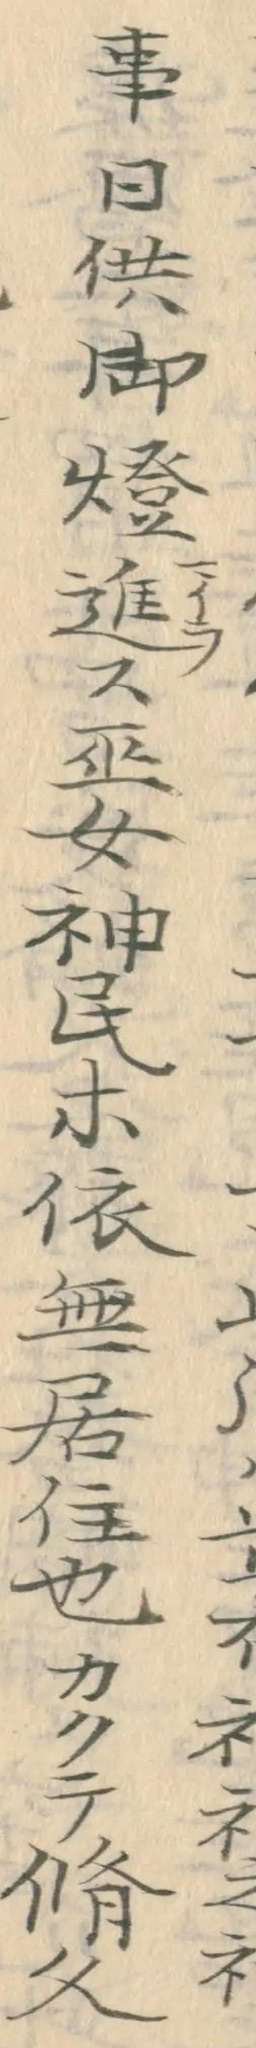事日供御燈進ス巫女神民等依無居住也カクテ脩久
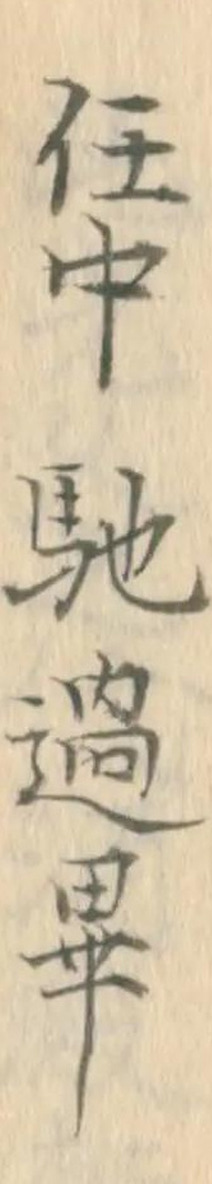任中馳過畢

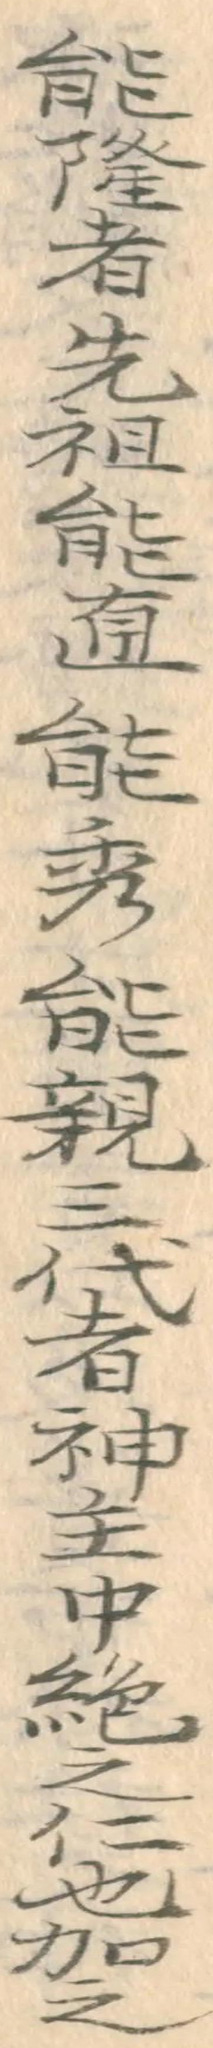能隆者先祖能直能秀能親三代者神主中絶之仁也加之
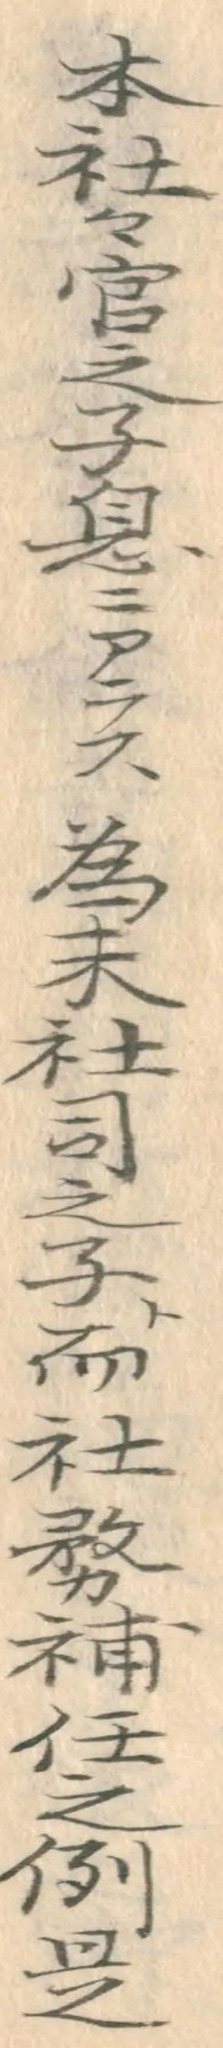本社々官之子息ニアラス為末社司之子ト而社務補任之例是
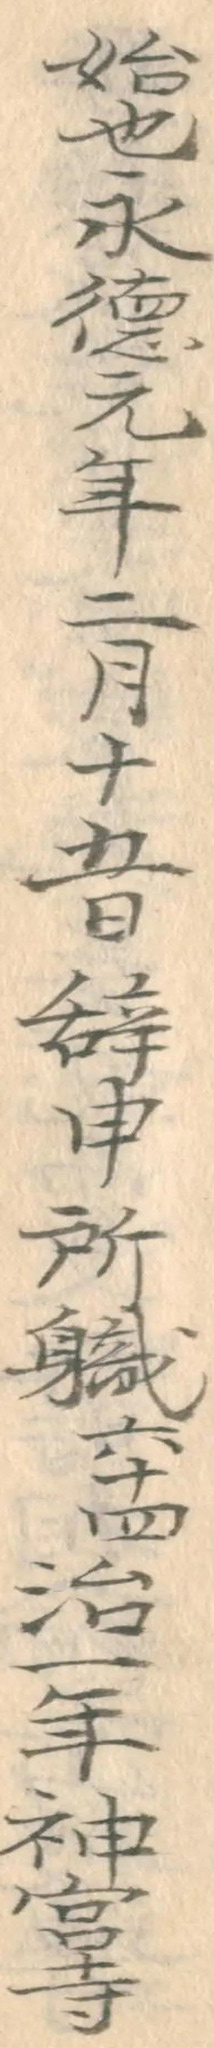始也永徳元年二月十五日辞申所職六十四治一年神宮寺
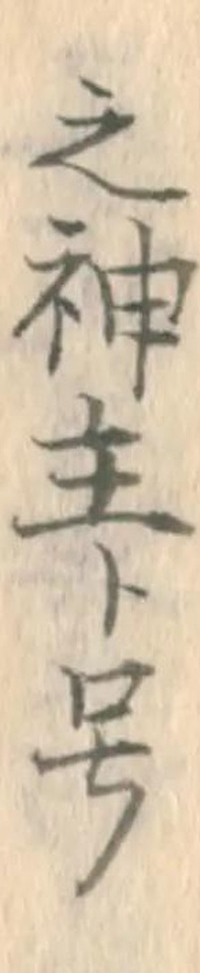之神主ト号
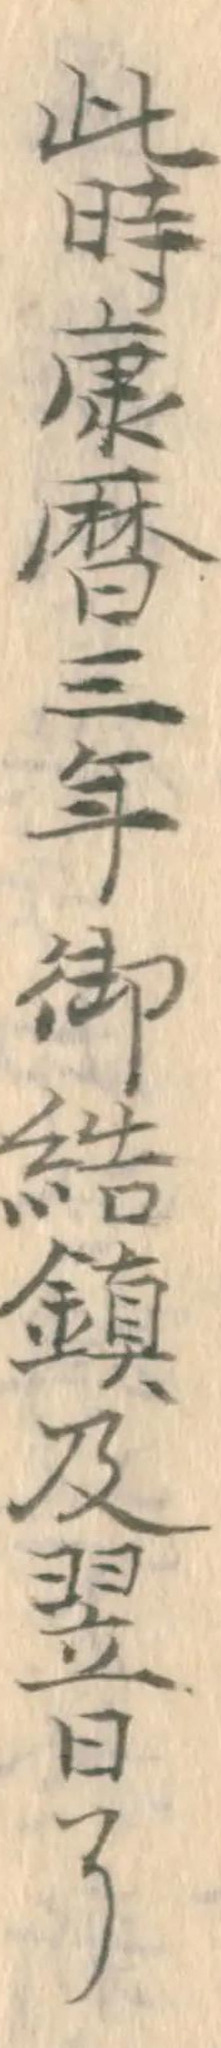此時康暦三年御結鎮及翌日了
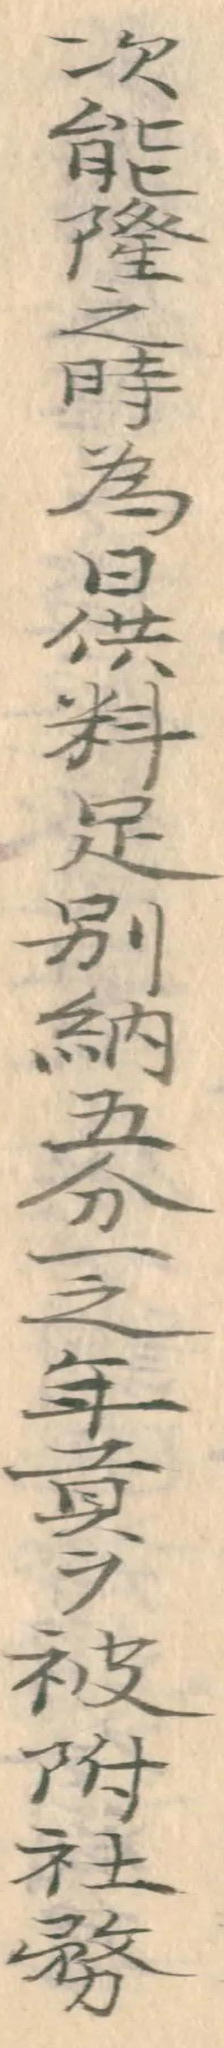次能隆之時為日供料足別納五分一之年貢ヲ被附社務
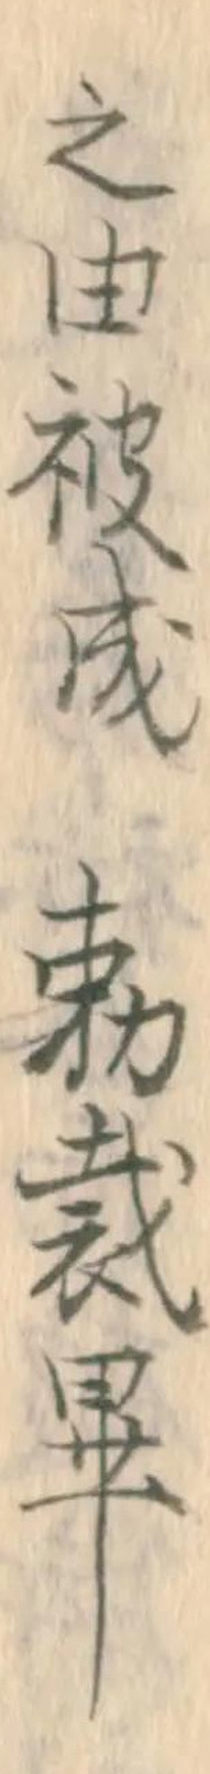之由被成勅裁畢
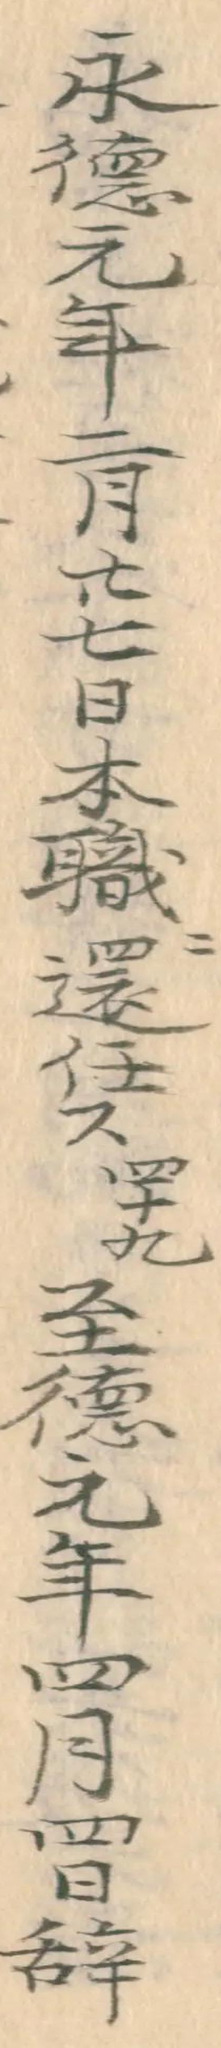永徳元年二月廿七日本職ニ還任ス四十九至徳元年四月四日辞
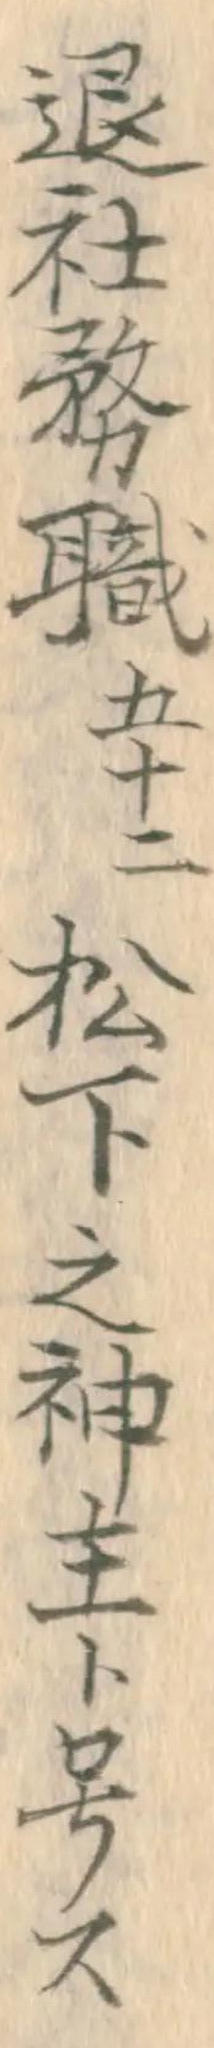退社務職五十二松下之神主ト号ス
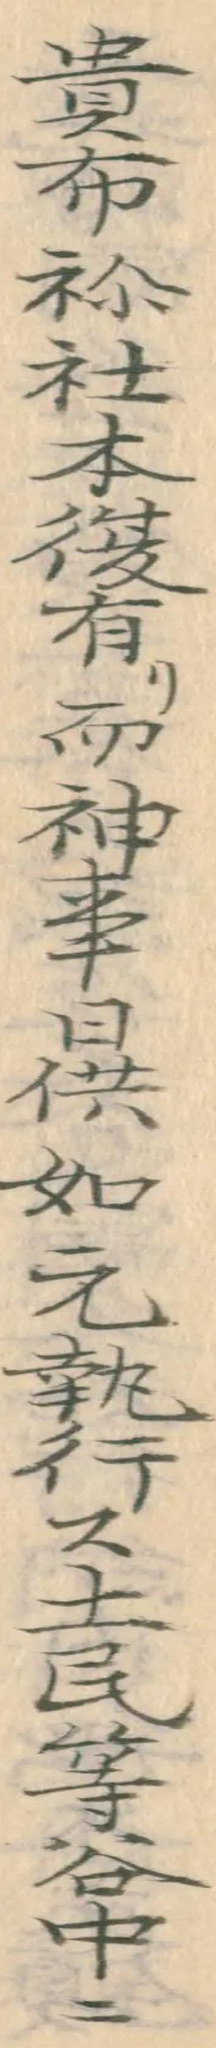貴布祢社本復有リ而神事日供如元執行ス土民等谷中ニ
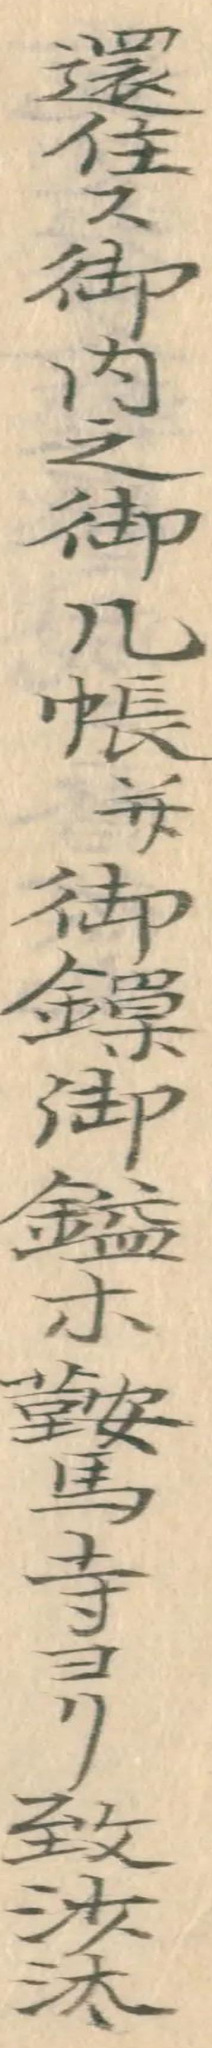還住ス御内之御几帳并御鏁御鎰等鞍馬寺ヨリ致沙汰
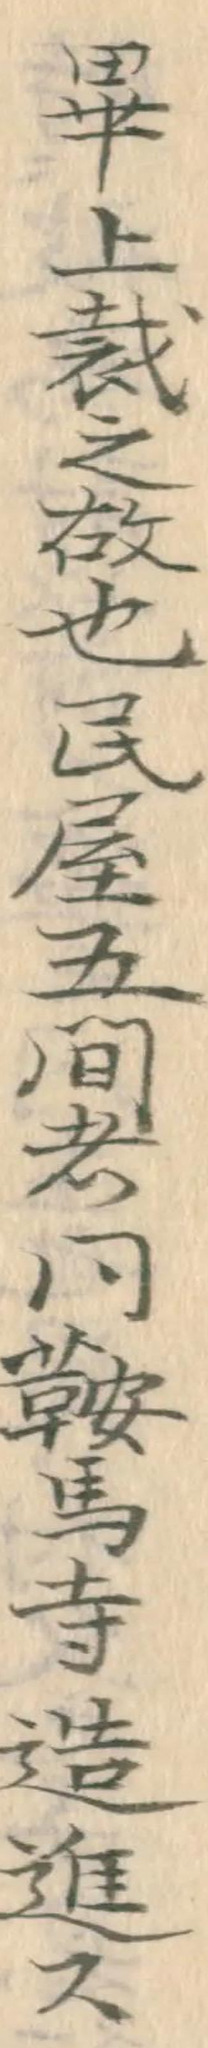畢上裁之故也民屋五間者同鞍馬寺造進ス
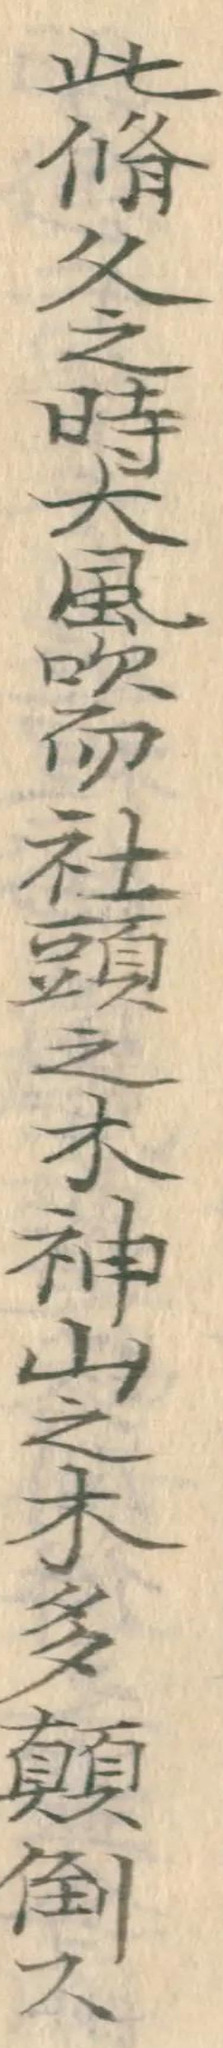此脩久之時大風吹而社頭之木神山之木多顛倒ス
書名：賀茂社記録. 第24冊
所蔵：国立国会図書館 National Diet Library, JAPAN
